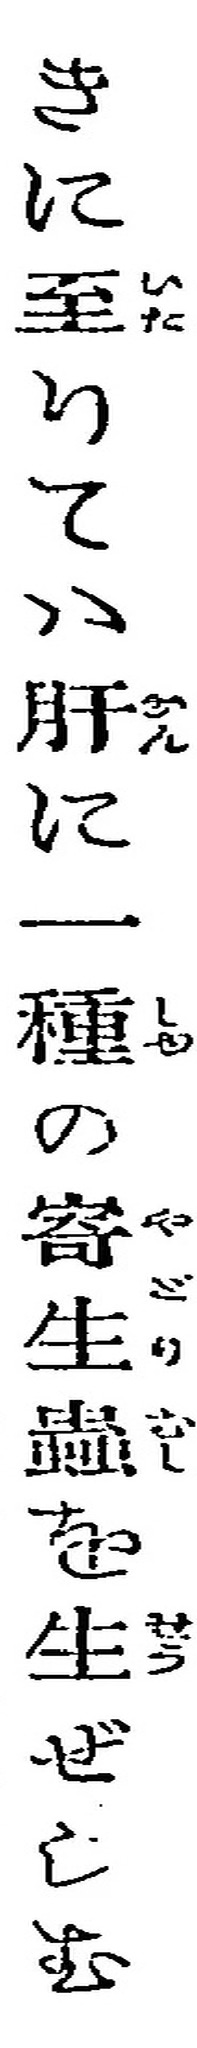きに至りては肝に一種の寄生蟲を生ぜしむ
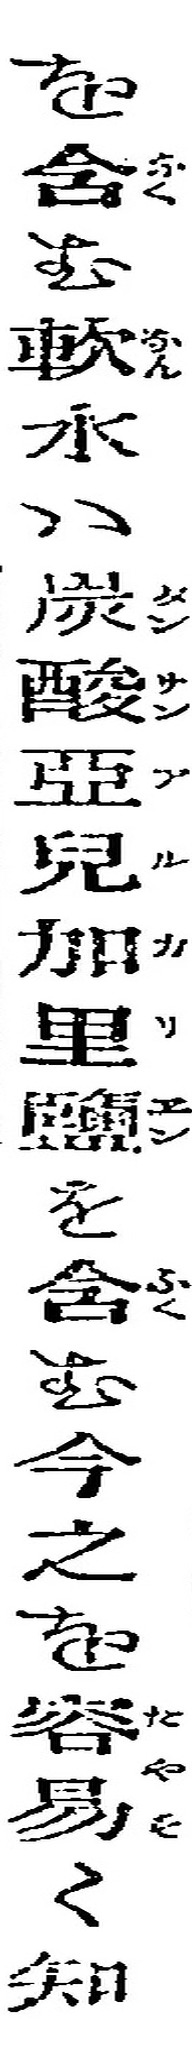を含む軟水は炭酸亞兒加里鹽を含む今之を容易く知
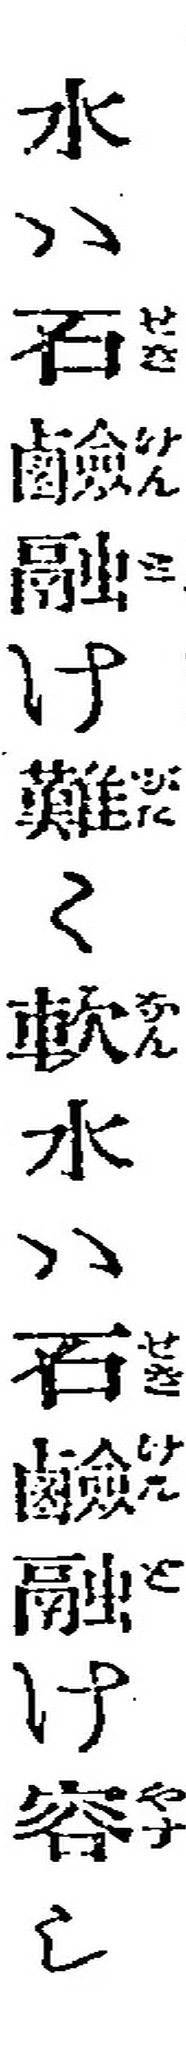水は石鹼融け難く軟水は石鹼融け容し
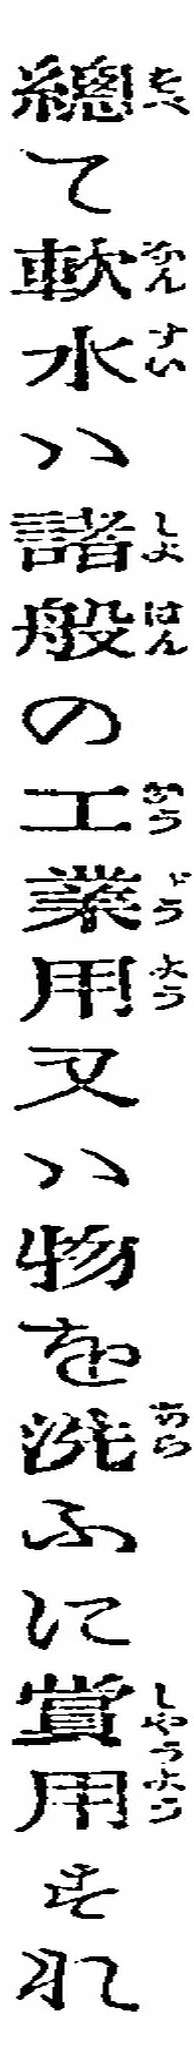総て軟水は諸般の工業用又は物を洗ふに賞用すれ
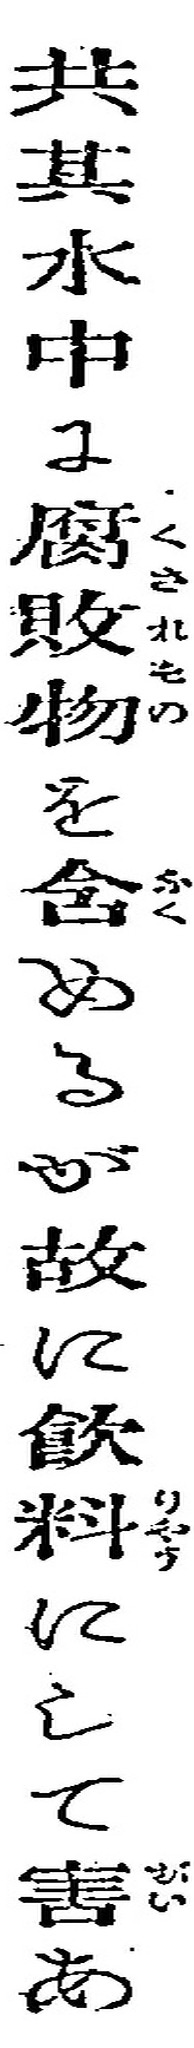共其水中に腐敗物を含めるが故に飲料にして害あ
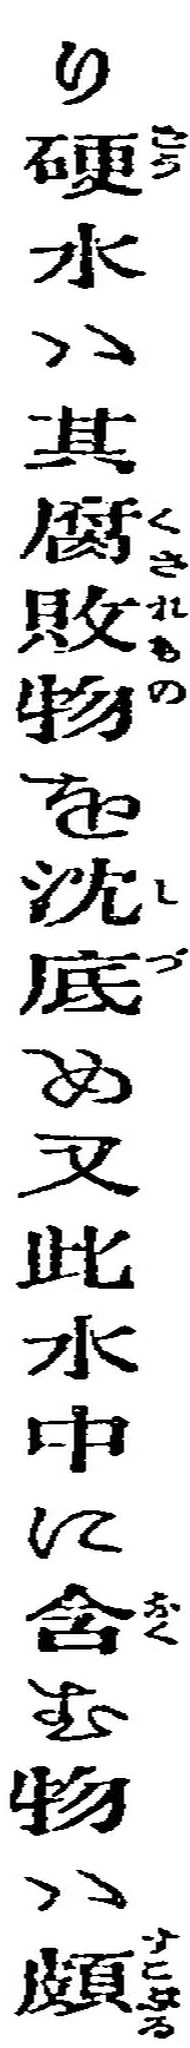り硬水は其腐敗物を沈底め又此水中に含む物は頗
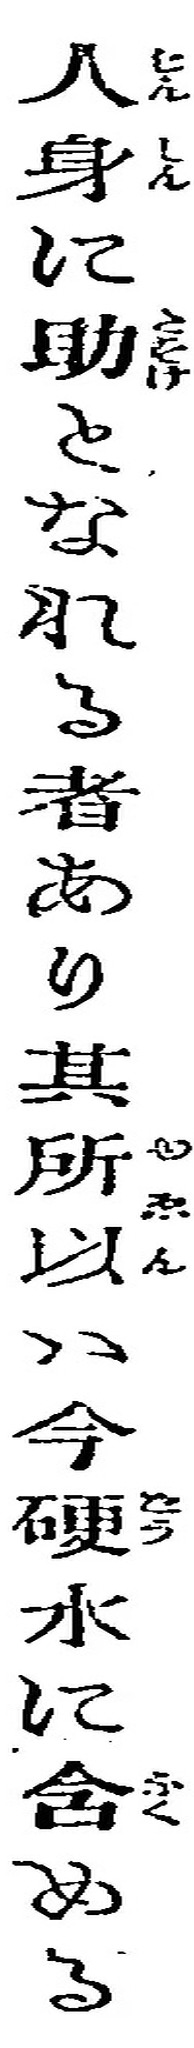人身に助となれる者あり其所以は今硬水に含める
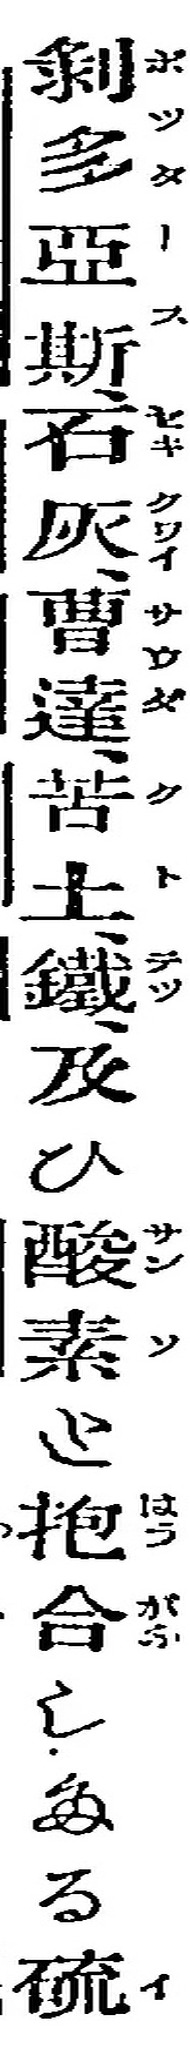剥多亞斯、石灰、曹達、苦土、鐵、及ひ酸素と抱合したる硫
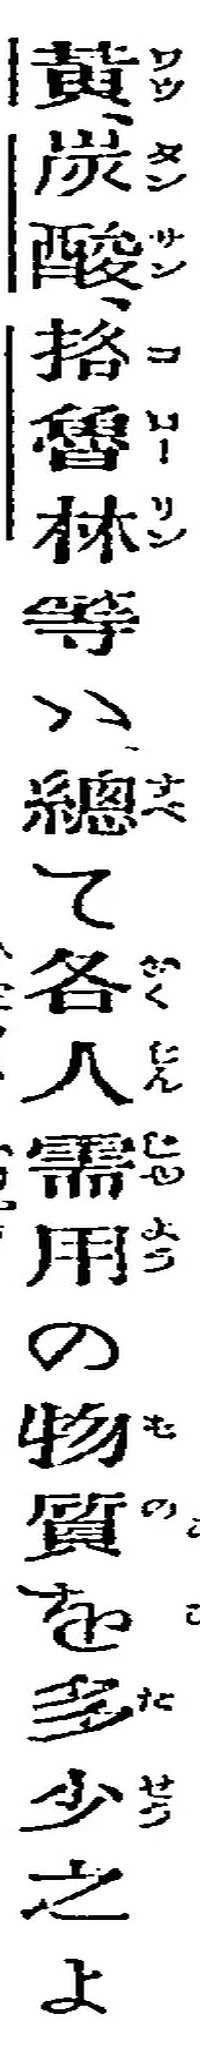黄、炭酸、挌魯林等は各人需用の物質を多少之よ
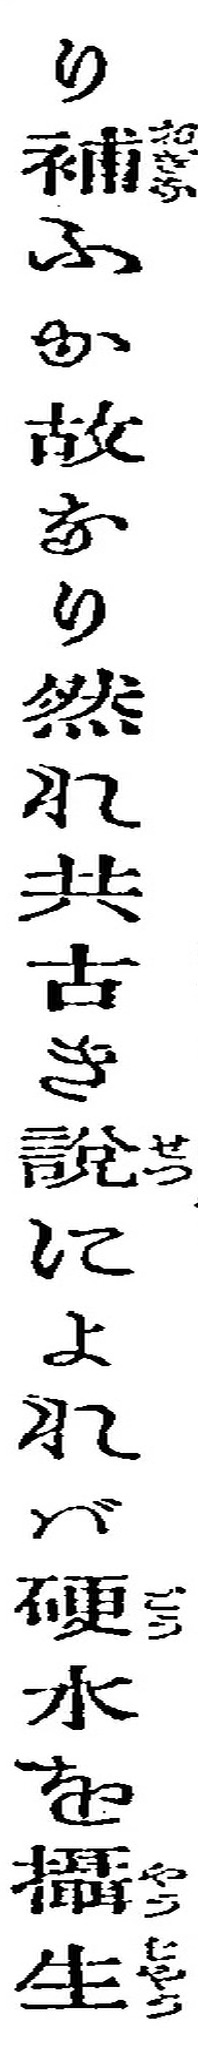り補ふか故なり然れ共古き説によれば硬水を攝生
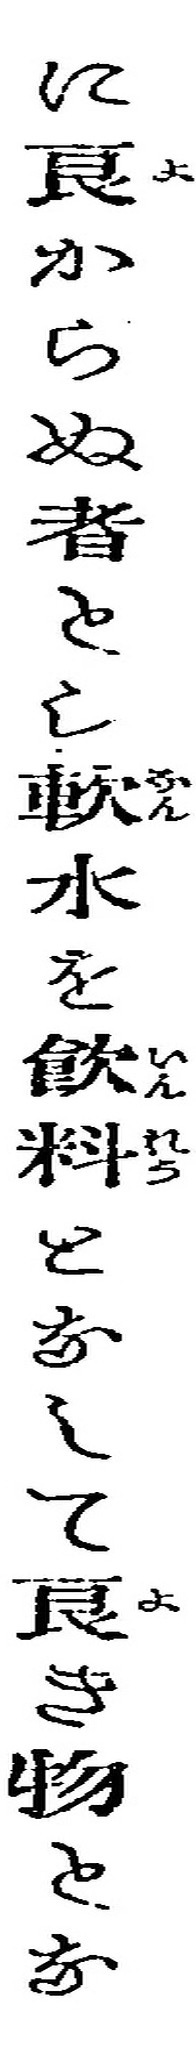に良からぬ者とし軟水を飲料となして良き物とな
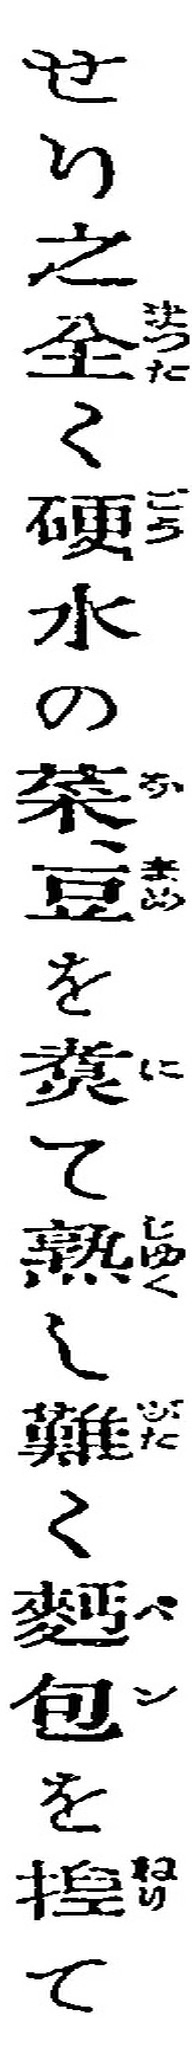せり之全く硬水の菜、豆を煮て熟しが難く麪包を捏て
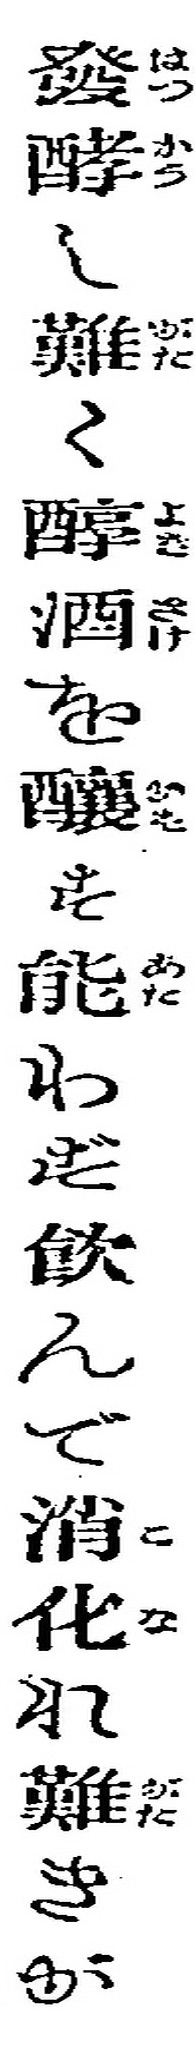発酵し難く醇酒を醸す能わず飲んで消化れ難きが
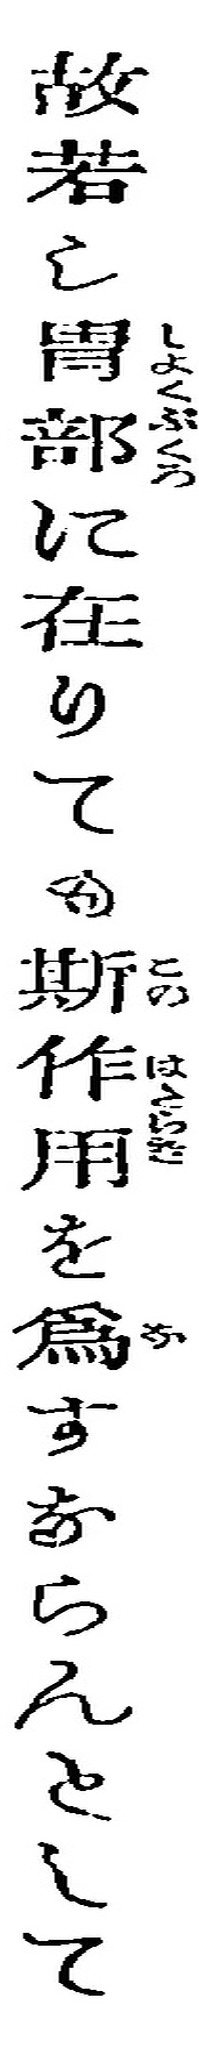故若し胃部に在りても斯作用を為すならんとして
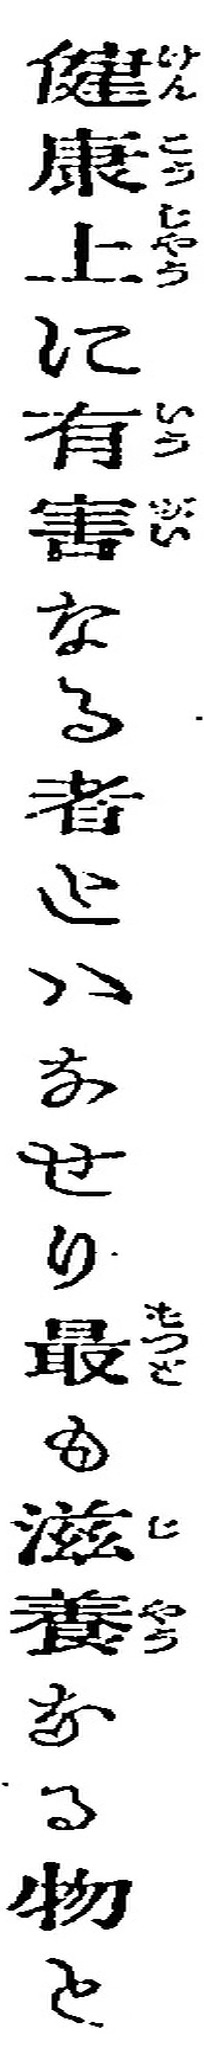健康上に有害なる者とはなせり最も滋養なる物と

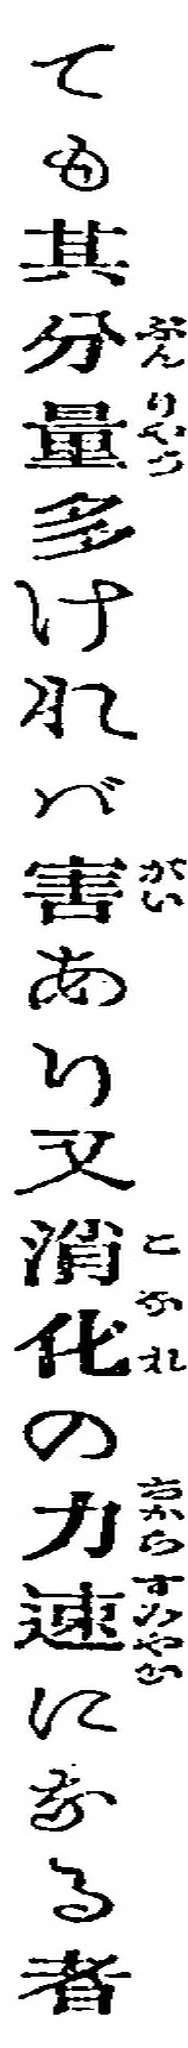ても其分量多ければ害あり又消化の力速になる者
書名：飲水の心得 : 伝染病の予防
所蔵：国立国会図書館 National Diet Library, JAPAN
